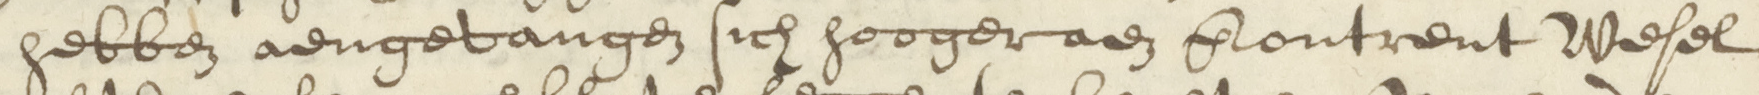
hebben aengevangen sich hoogeraen & ontrent Wesel
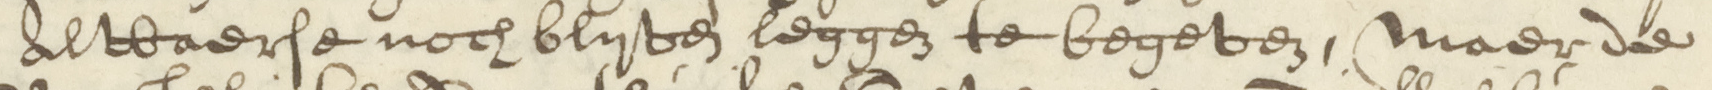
alwaerse noch blijven leggen te begeven, maer de
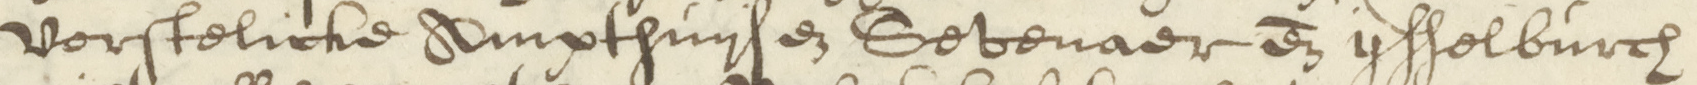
vorstelicke Ampthuijsen Sevenaer en ijsselburch
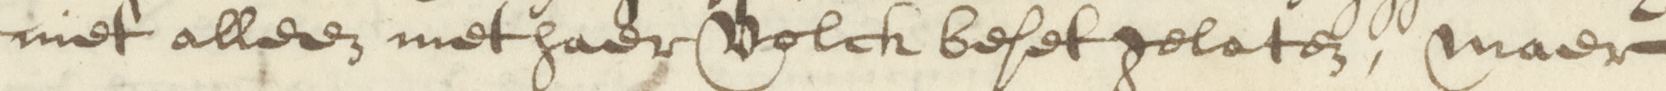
niet alleen met haer Volck beset gelaten, maer
